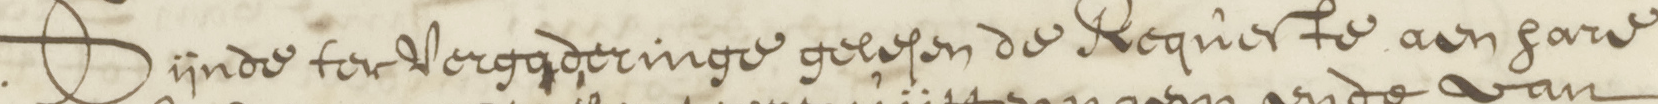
Sijnde ter Vergaderinge gelesen de Requeste aen hare
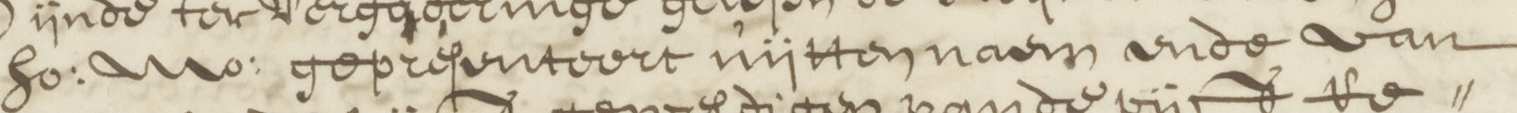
ho:Mo: gepresenteert uijtten naem ende van
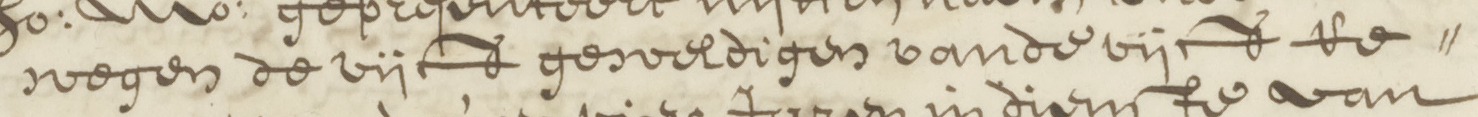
wegen de vijff geweldigen vande vijff Re„
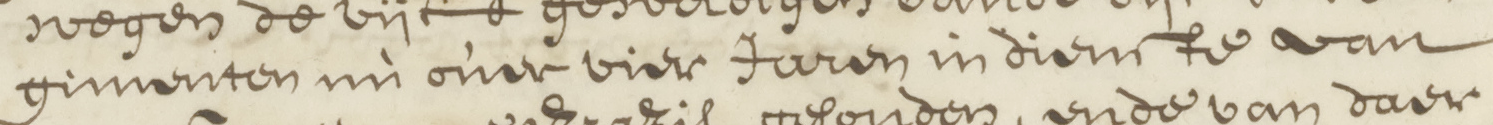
gimenten nu ouer vier Jaren in dienste van
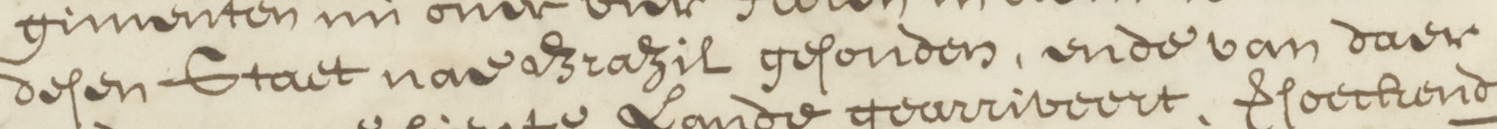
desen Staet nae Brazil gesonden, ende van daer
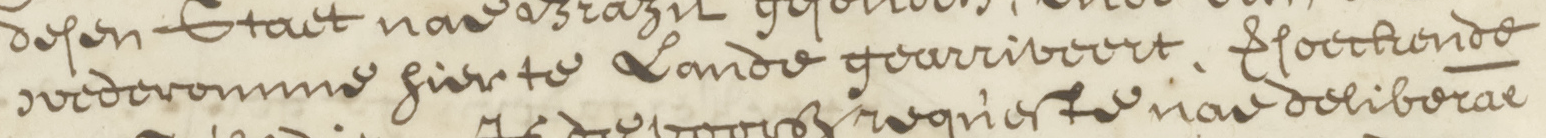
wederomme hier te Lande gearriveert, vsoeckende
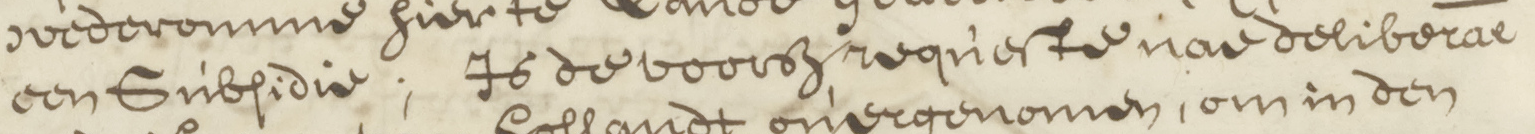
een Subsidie; Is de voorsz requeste nae deliberae
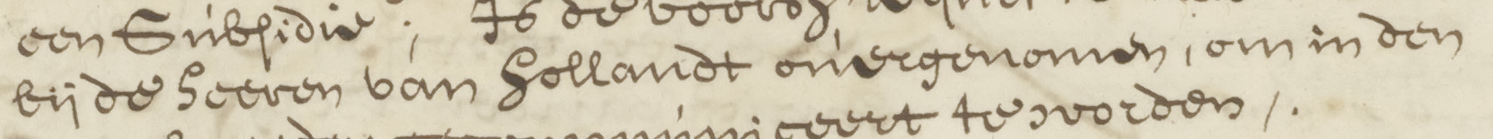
bij de heeren van Hollandt ouergenomen, om in den
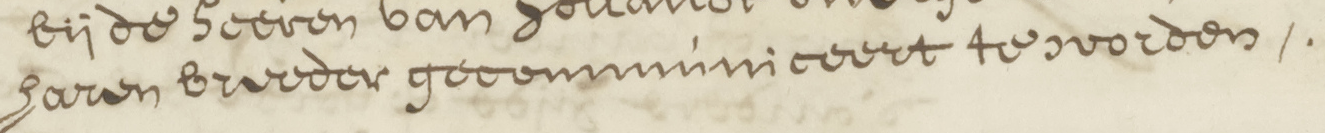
haren breeder gecommuniceert te worden.
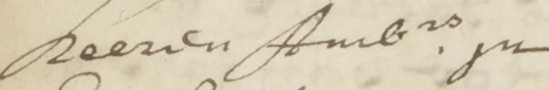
heeren Ambrs. in
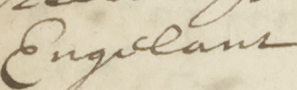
Engelant
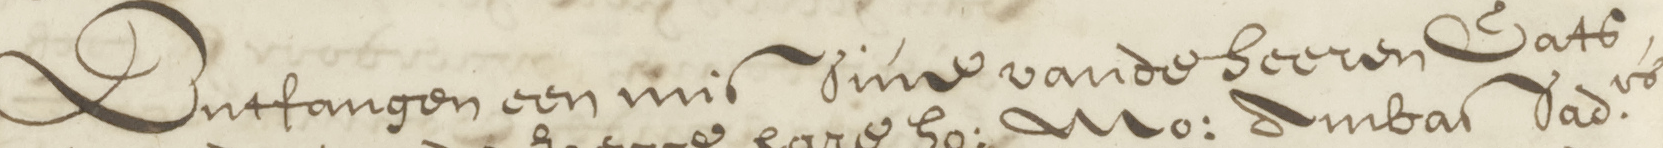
Ontfangen een missive vande heeren Cats,
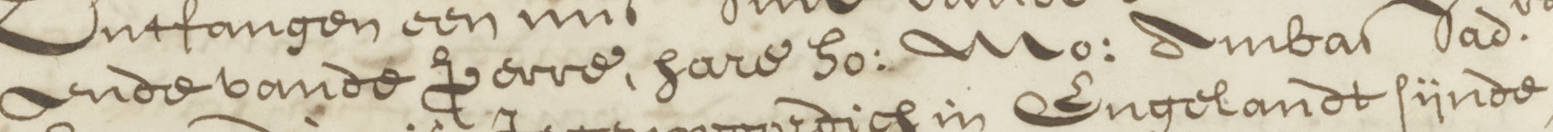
ende vande Perre, hare ho:Mo: Ambassadrs.
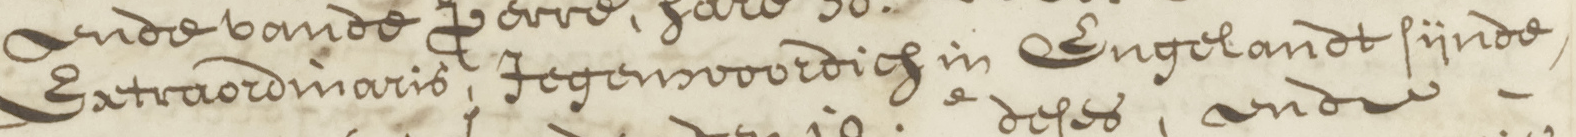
Extraordinaris, Jegenwoordich in Engelandt sijnde,
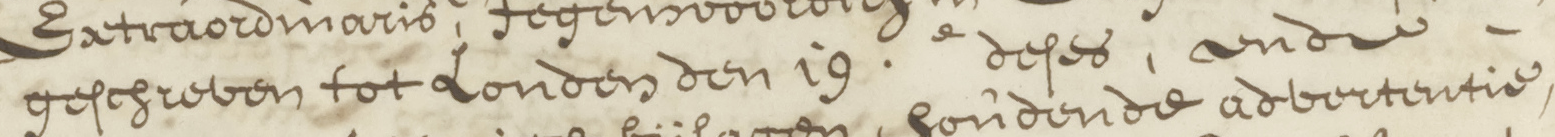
geschreven tot Londen den 19.e deses, ende -
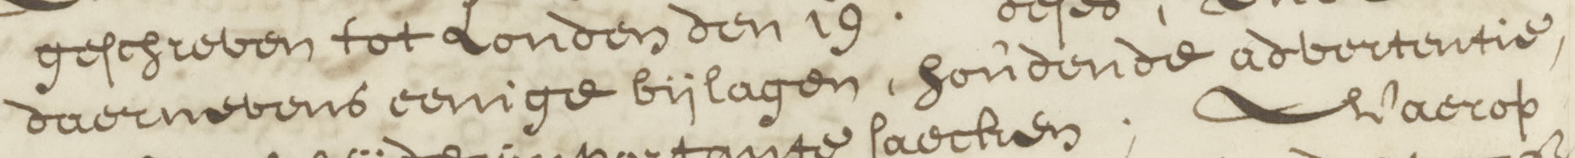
daernevens eenige bijlagen, houdende advertentie,
